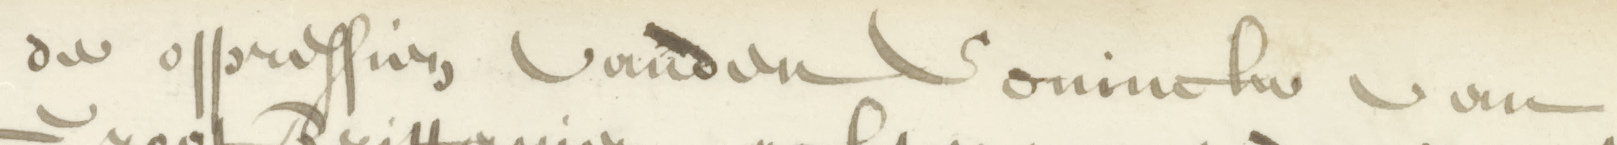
de oppressien vanden Coninck van
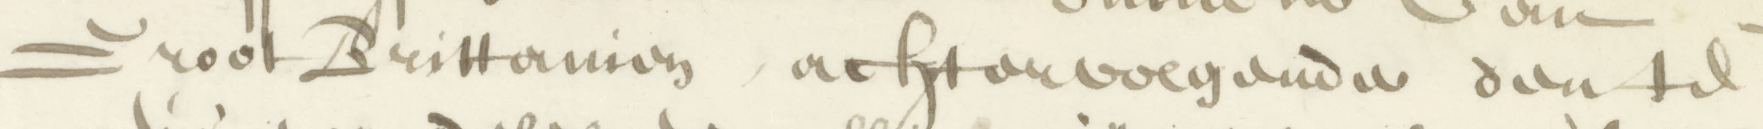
Groot Brittanien, achtervolgende den te
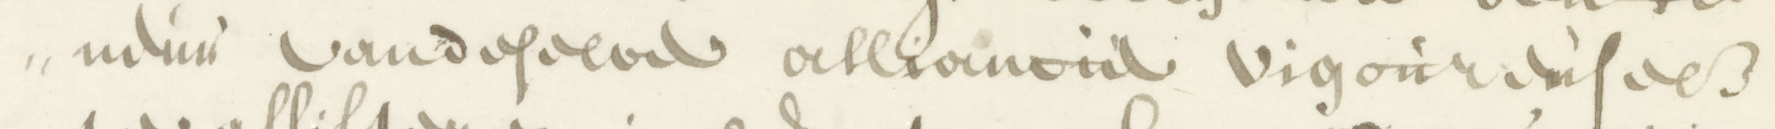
„neur van deselve alliancie vigoureusel
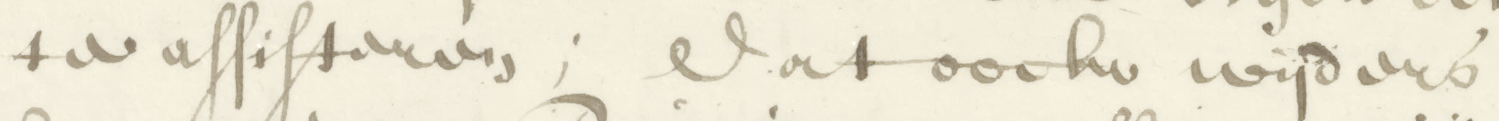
te assisteren; Dat oock wijders hij
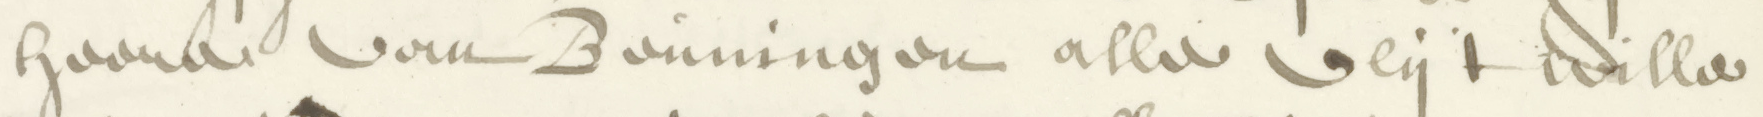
heere van Beuningen alle vlijt wille
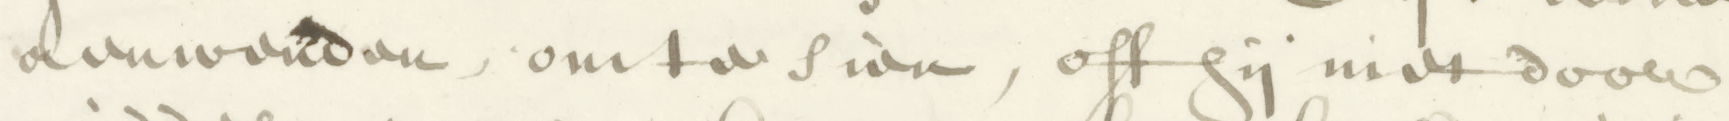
aenwenden, om te sien, off hij niet door
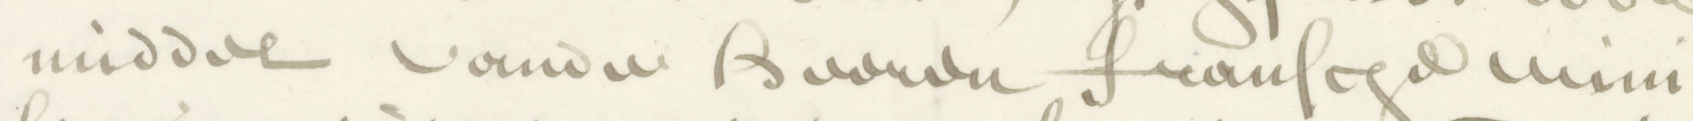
middel vande Heeren fransche Mini
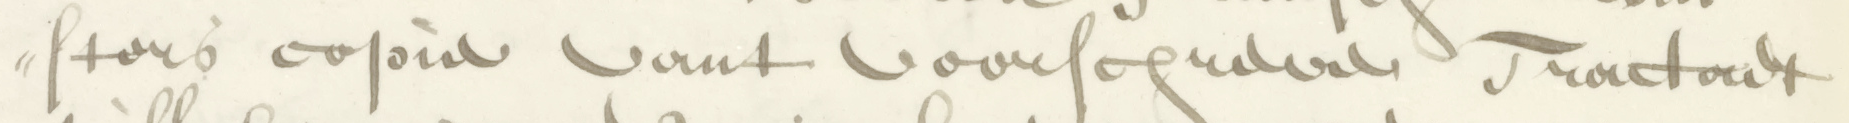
„sters copie vant voorschreven Tractaet
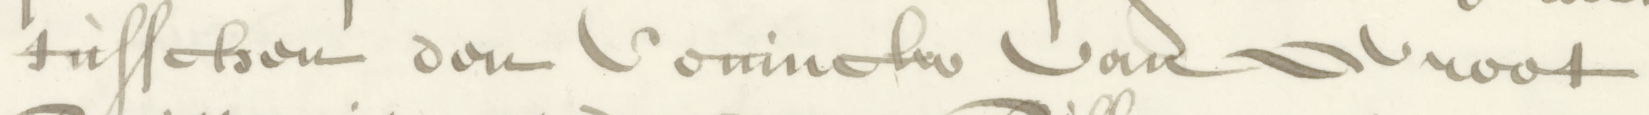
tusschen den Coninck van Groot
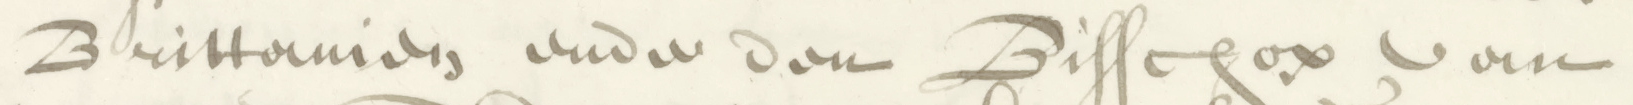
Brittanien ende den Bisschop van
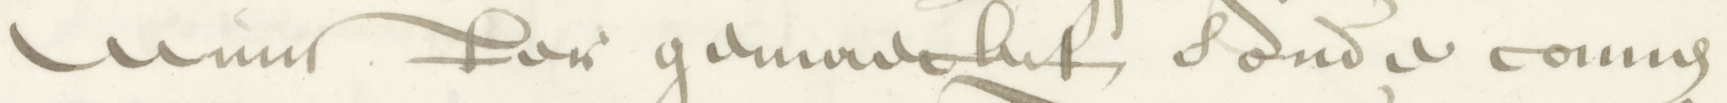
Munster gemaeckt, soude connen
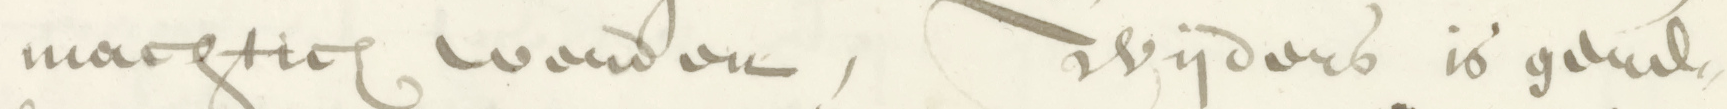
machtich werden. Wijders is gere,,
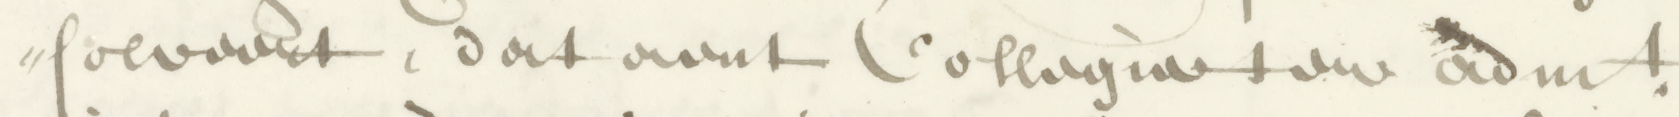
„solveert, dat aent Collegie ter admt.
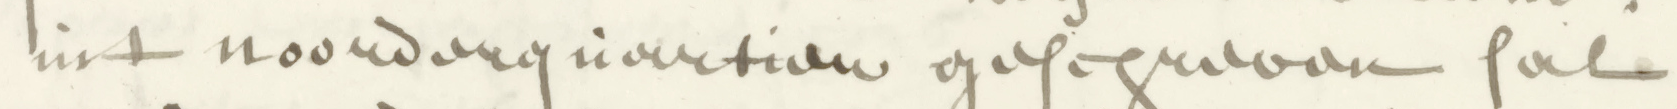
int noorderquartier geschreven sal
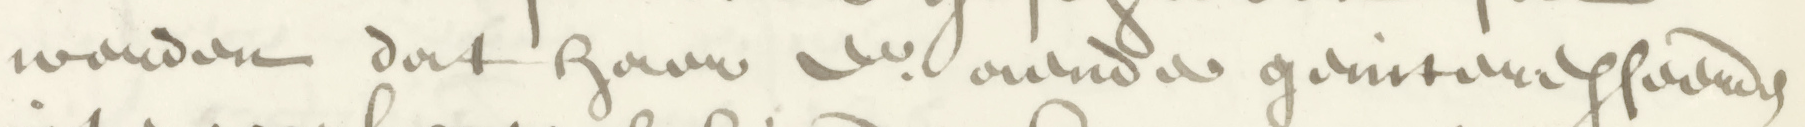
werden dat haer E. aende geinteresseerden
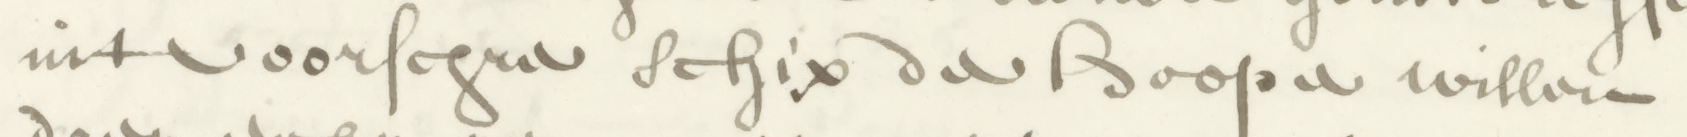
int voorschre schip de Hoope willen
